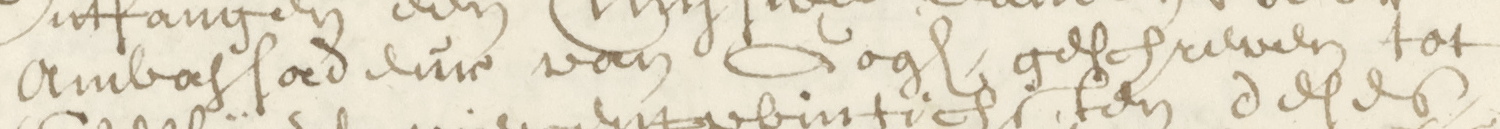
Ambassadeur van Gogh, geschreven tot
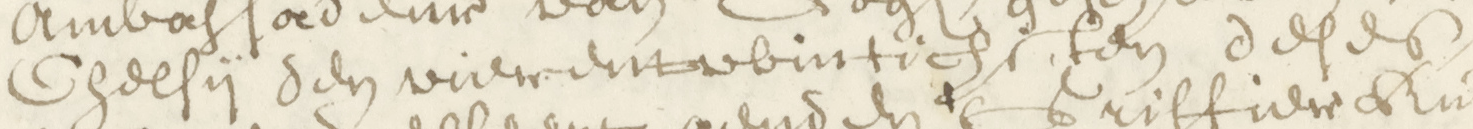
Chelsij den vierentwintichsten deses
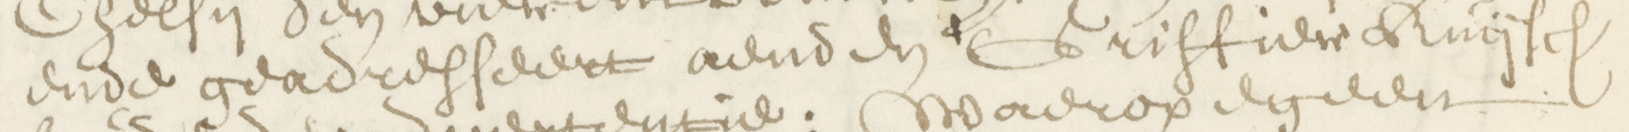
ende geadresseert aenden Griffier Buijsch,
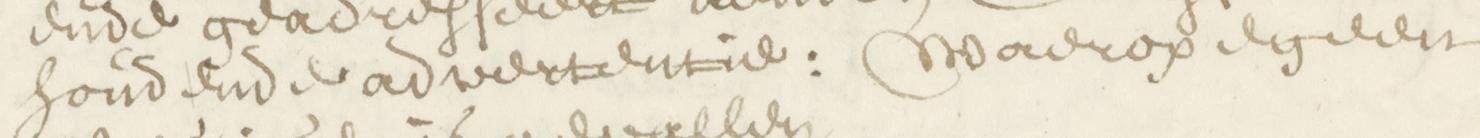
houdende advertentie: Waerop egeen
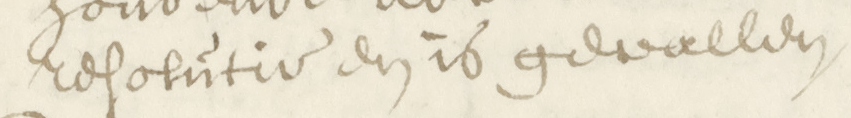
resolutie en is gevallen.
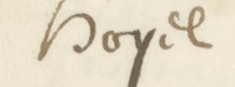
Hoyel
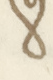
ca
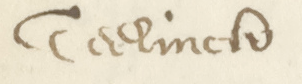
Teelinck
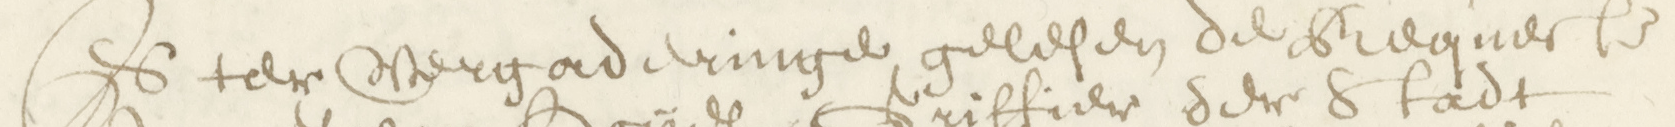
Is ter vergaderinge gelesen de Requeste
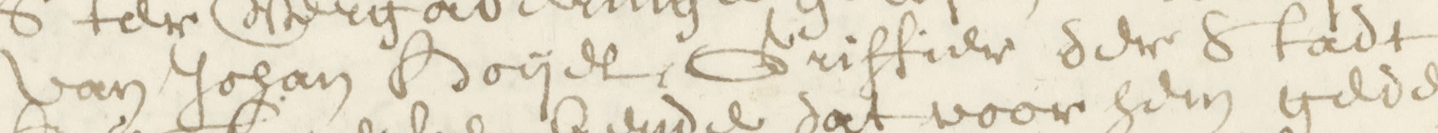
van Johan Hoijel, Griffier der Stadt
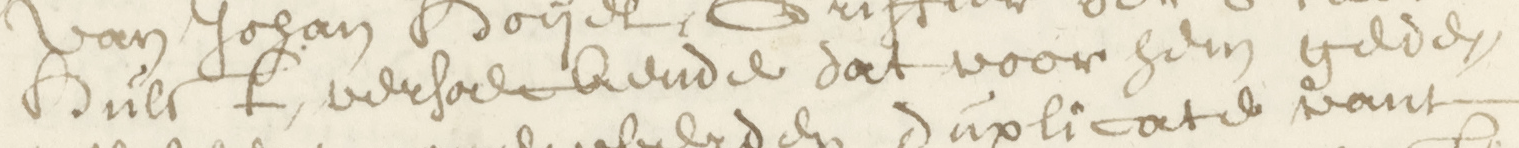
Hulst, versoeckende dat voor hem gede„
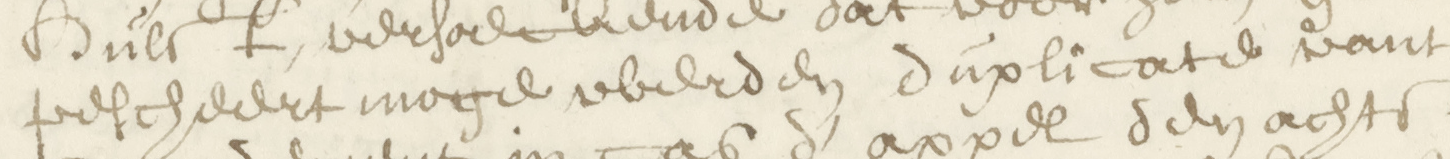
pescheert moge werden duplicate vant
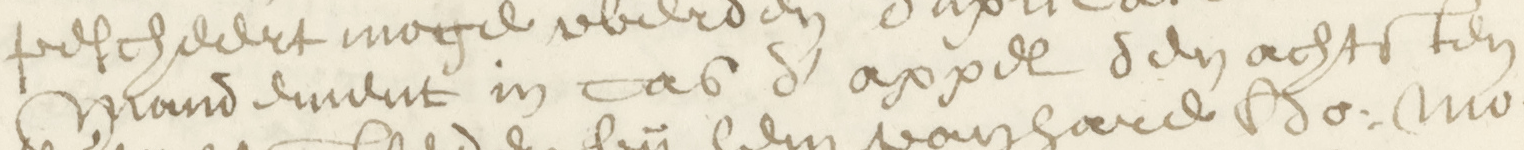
mandement in cas d'appel den achtsten
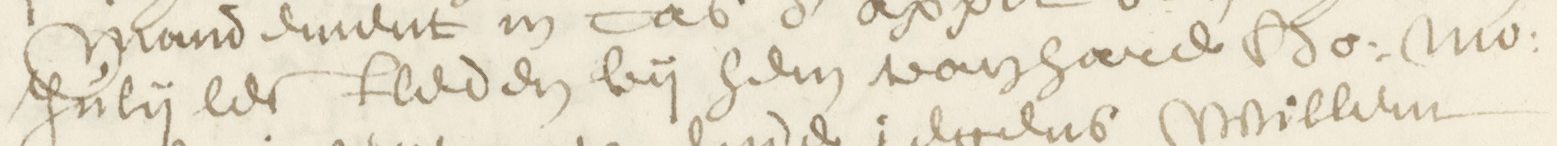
Julij lestleden bij hem van hare Ho:Mo:
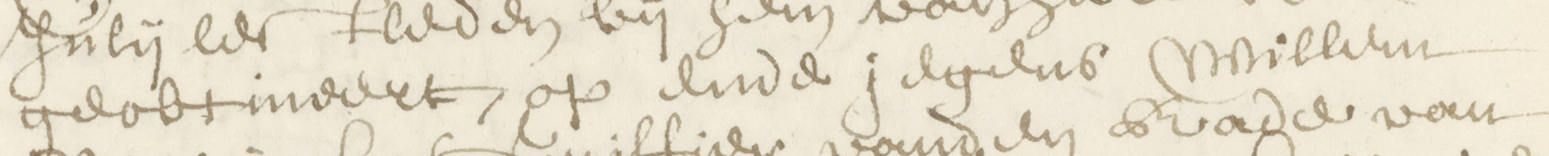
geobtineert, op ende jegens Willem
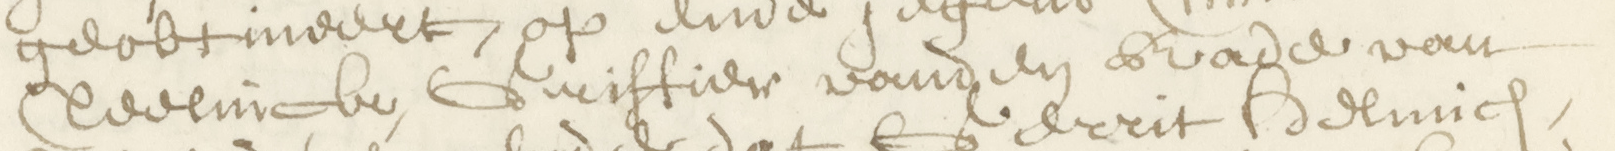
Teelinck, Griffier vanden Rade van
